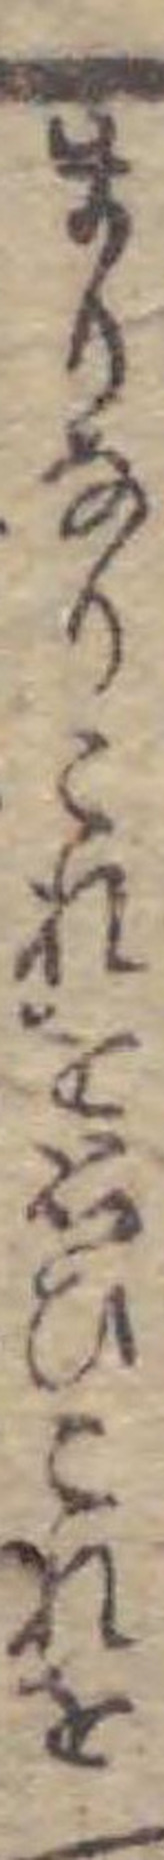まりなりこれを思ひこれを
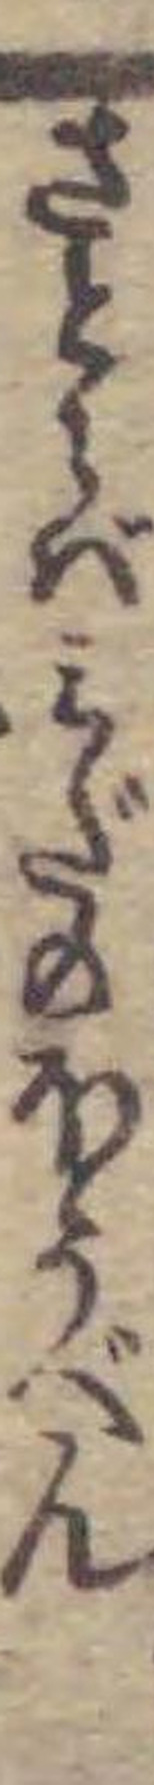さとらばみだのほうべん
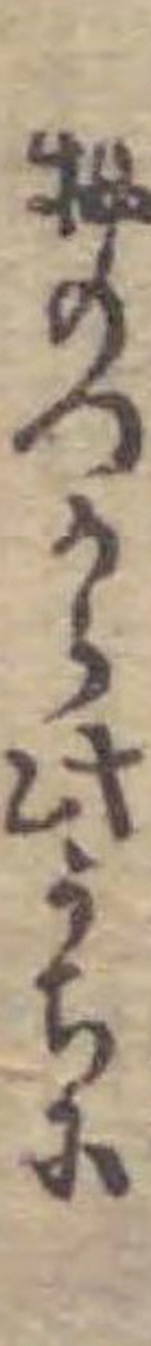おのつから此うちに
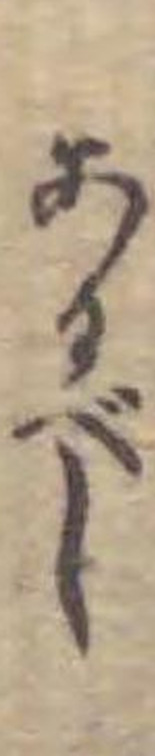あるべし
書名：北国順礼唄方便 : 3巻
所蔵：国立国会図書館 National Diet Library, JAPAN
